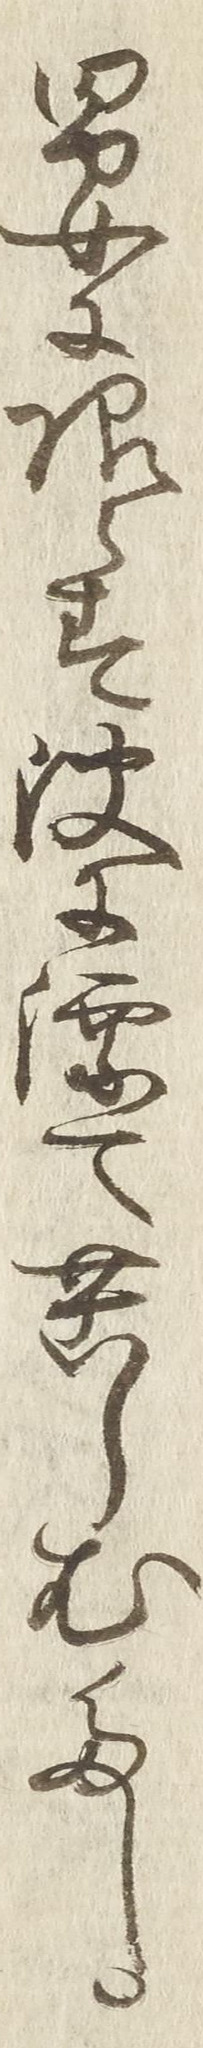男女に限らす波に漂て苦しむ多し◦
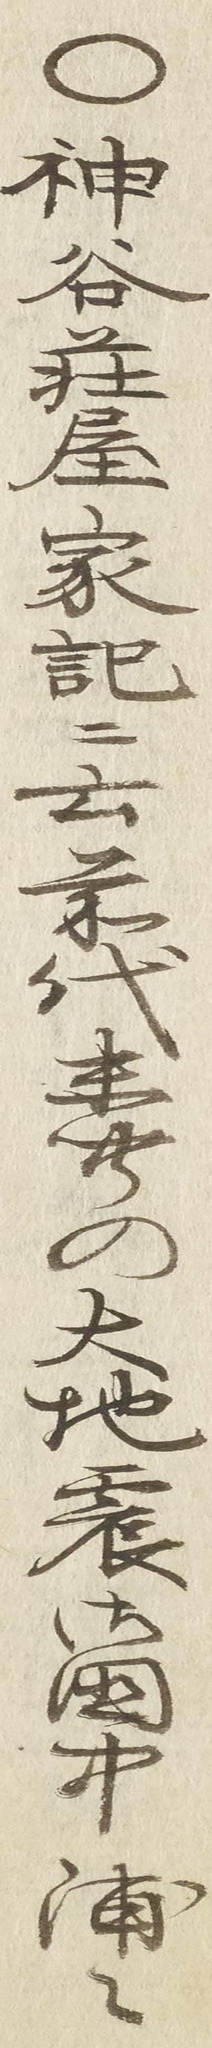〇神谷荘屋家記に云前代未聞の大地震御国中浦々
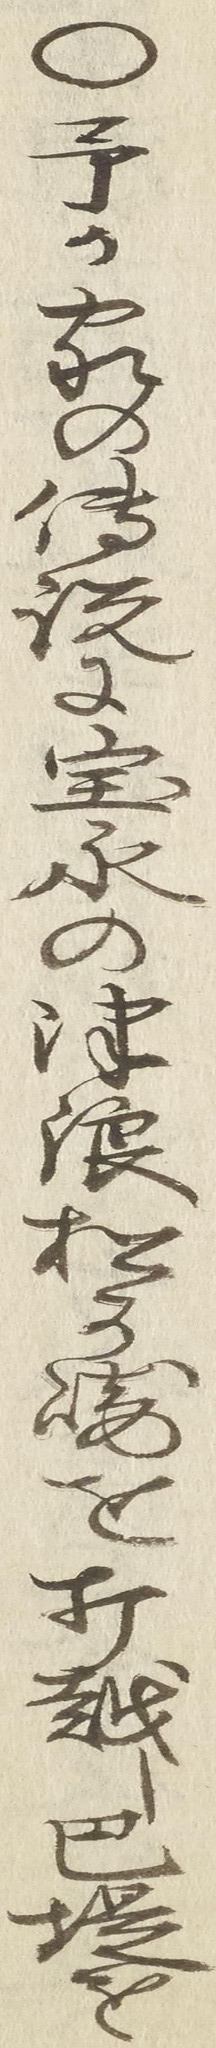〇予の家の伝説に宝永の津波松か崎を打越し巴堤を
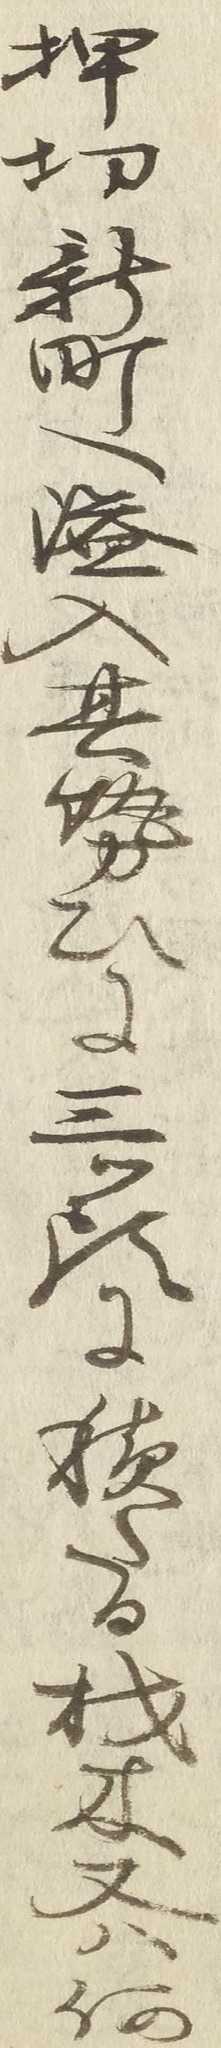押切新町へ溢入其勢ひに三ッ頭に積たる材木又は何
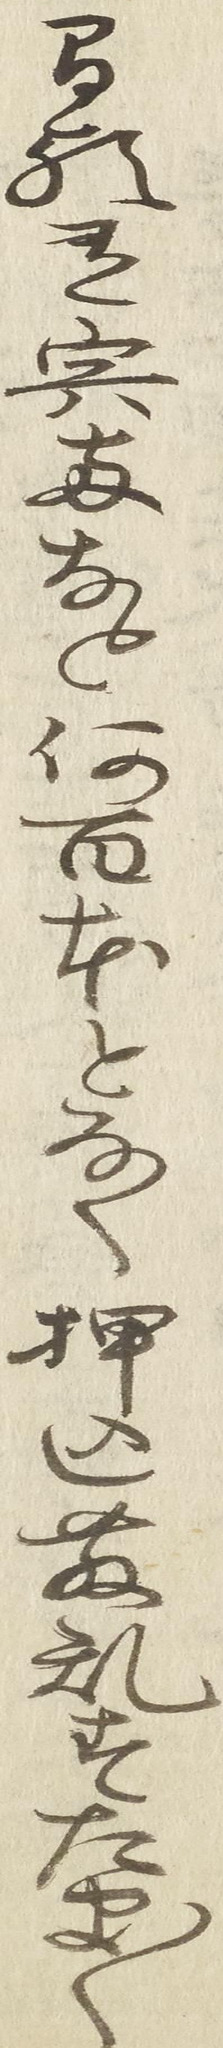間歟有宍両なと何百本となく押込散乱すたま〳〵
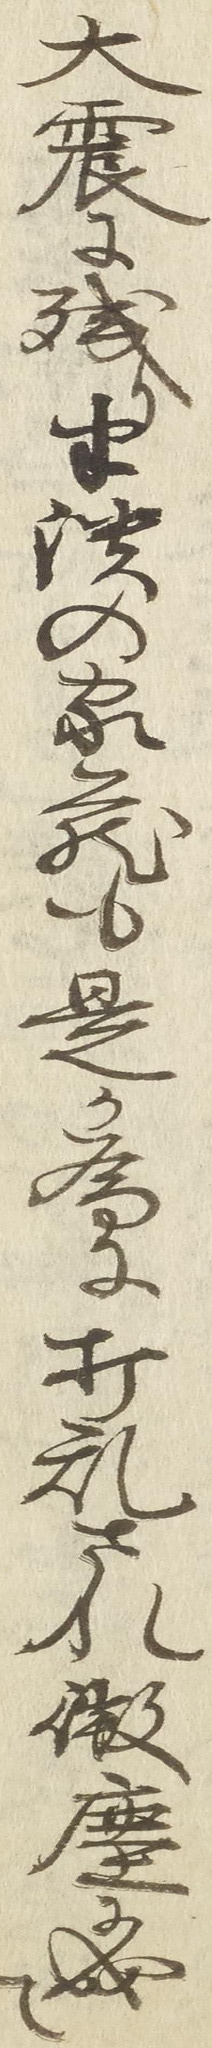大震に残り半潰の家蔵も是か為に打乱され微塵に成て
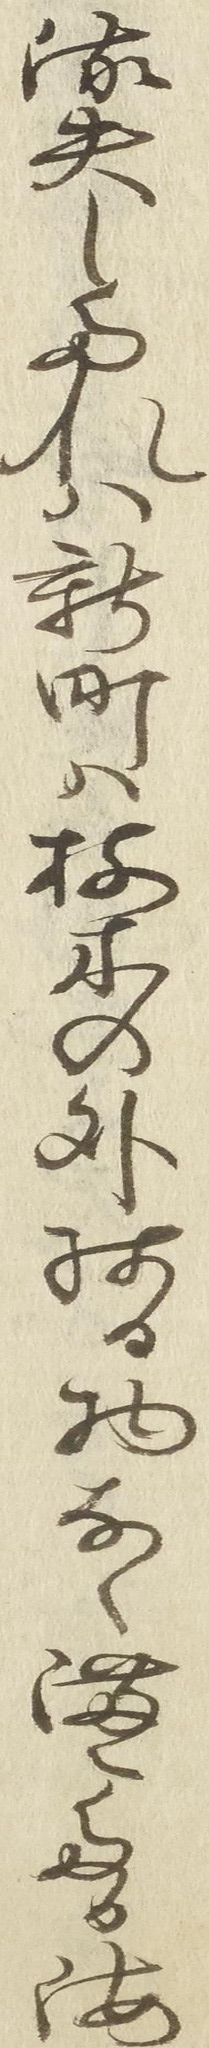流失したれは新町は枝木の外残る物なく満々たる海

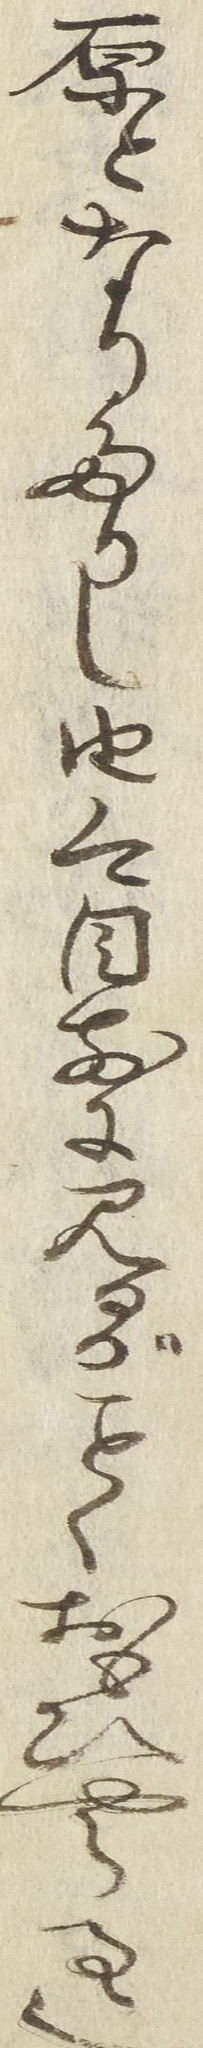原となりたりし由今目前に見るがことくおもひやらるゝ也
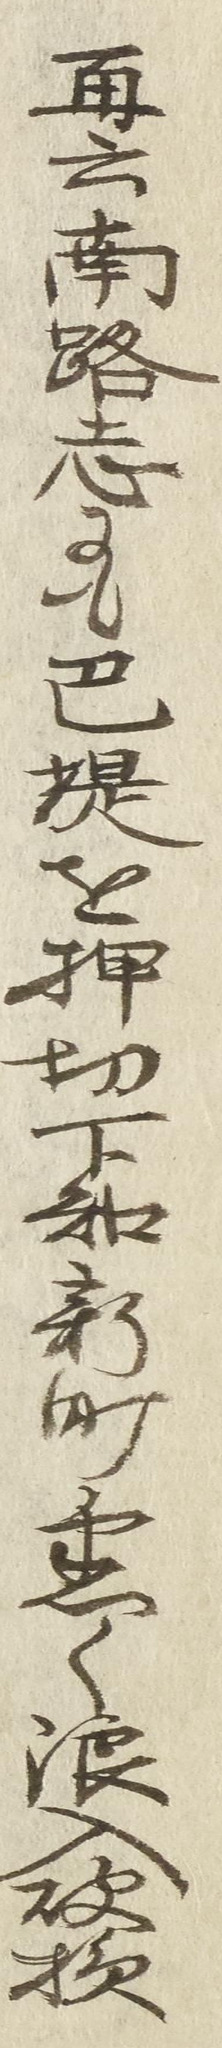再云南路志にも巴堤を押切下知新町悉く浪入破損
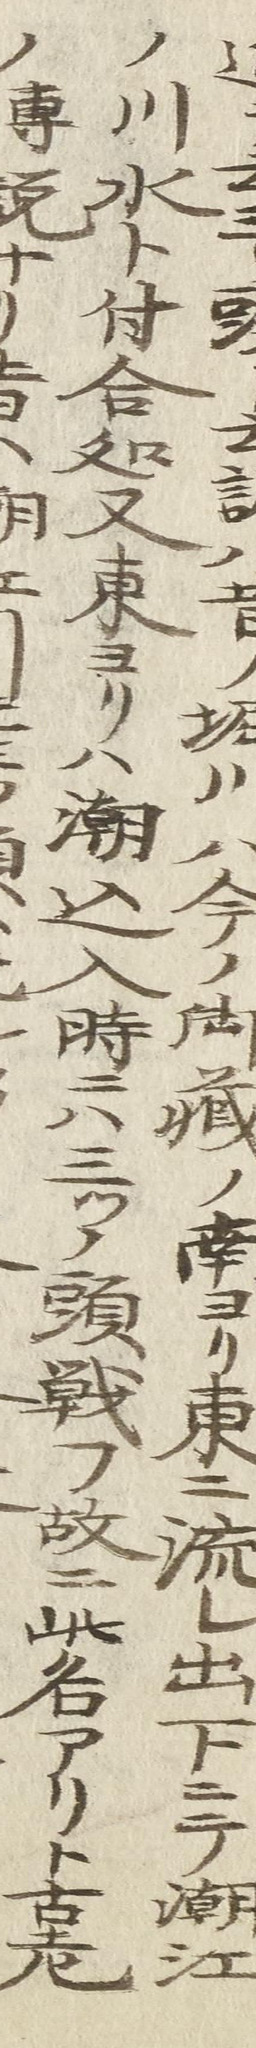の川水と付合処又東よりは潮込入時には三ツの頭戦ふ故に此名ありと古老
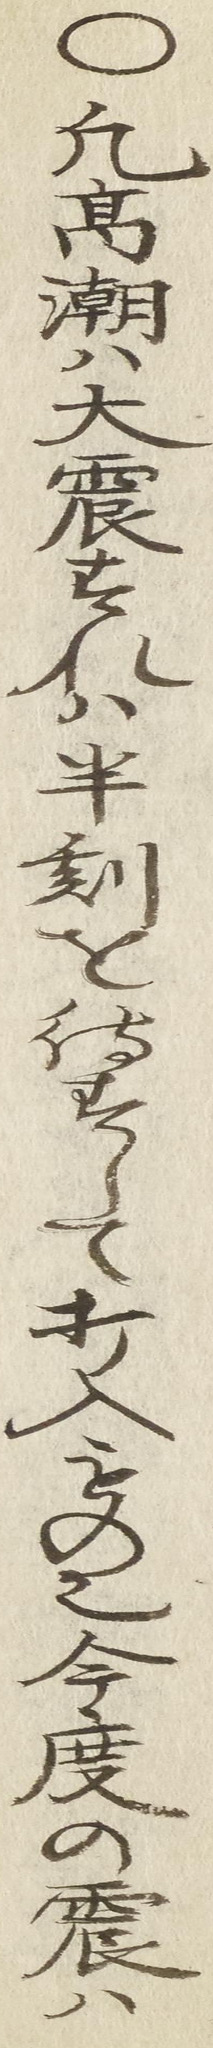〇凡高潮は大震すれは半刻を待すして打入もの也今度の震は
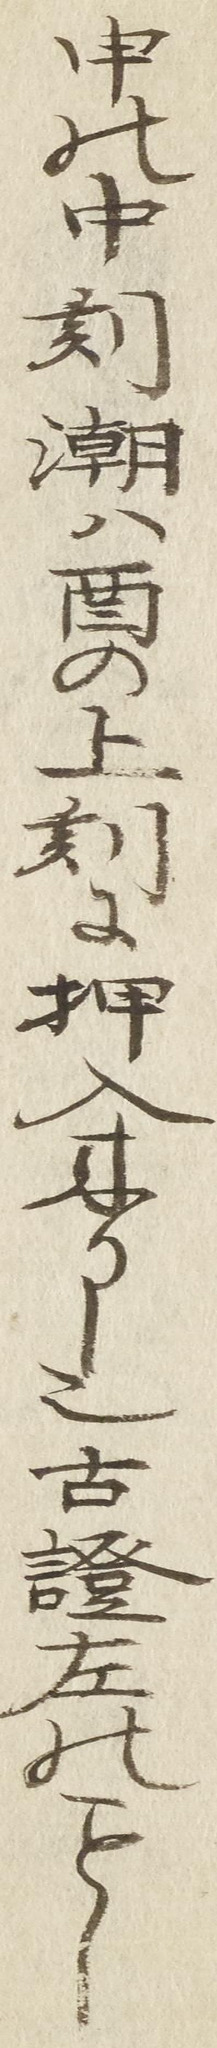申の中刻潮は酉の上刻に押入来りし也古証左のことし
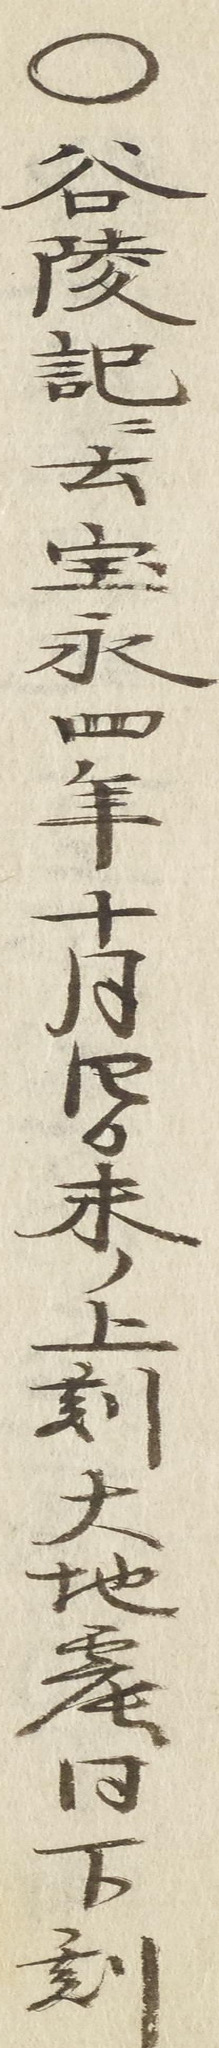〇谷陵記に云宝永四年十月四日未の上刻大地震同下刻
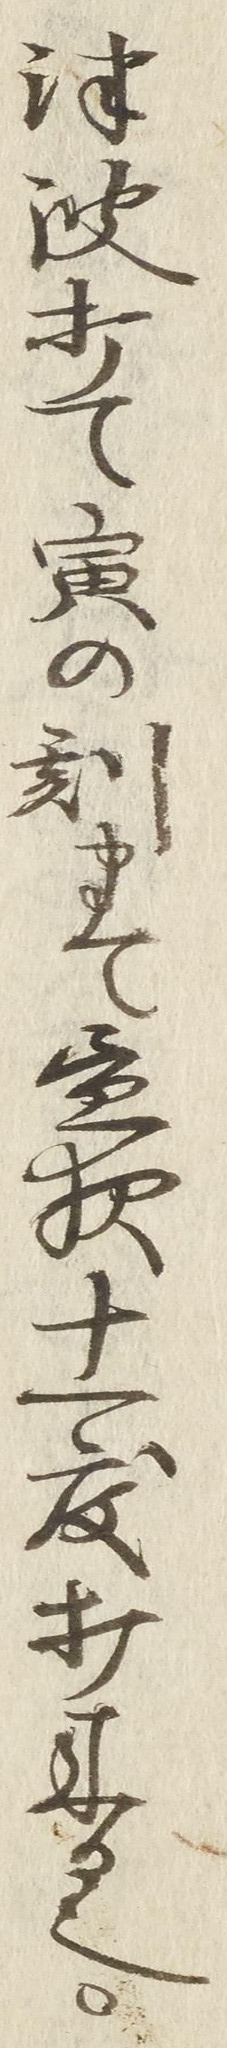津波打て寅の刻まて昼夜十一度内来る也◦
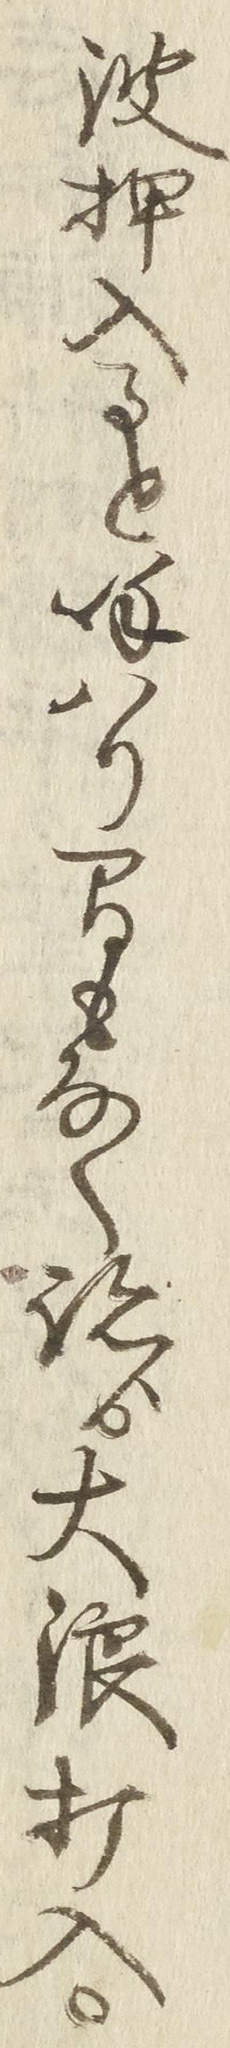波押入ると呼はり間もなく跡より大浪打入◦
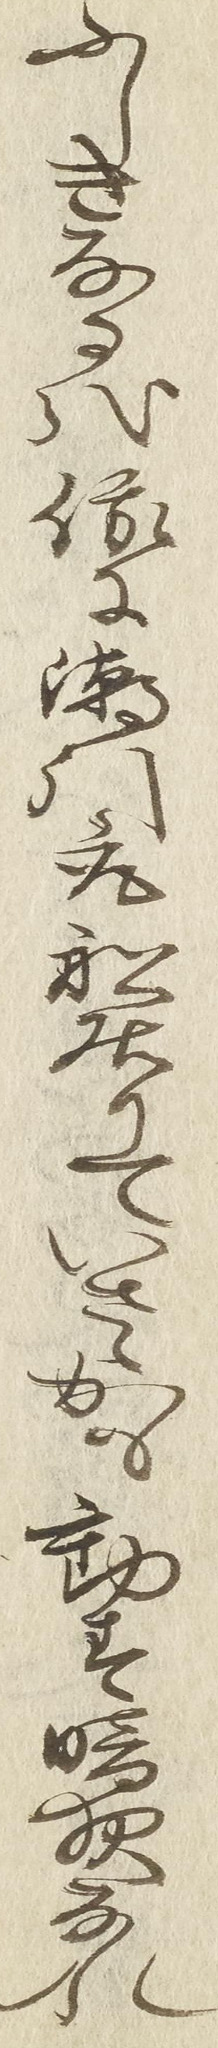ふしきなる哉俄に潮引取船居りていさゝかも動す暗夜なれ
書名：地震記　上
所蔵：東京大学地震研究所図書室 Earthquake Research Institute Library, The University of Tokyo, JAPAN
